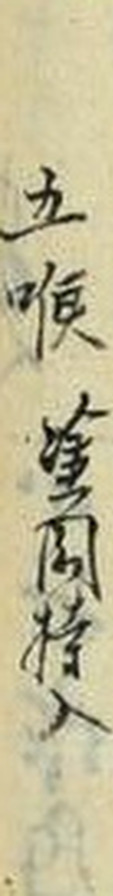活鯉五喉塗岡持入
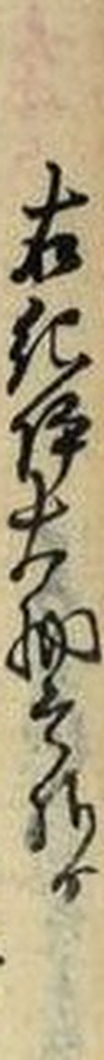右紀伊大納言様ゟ
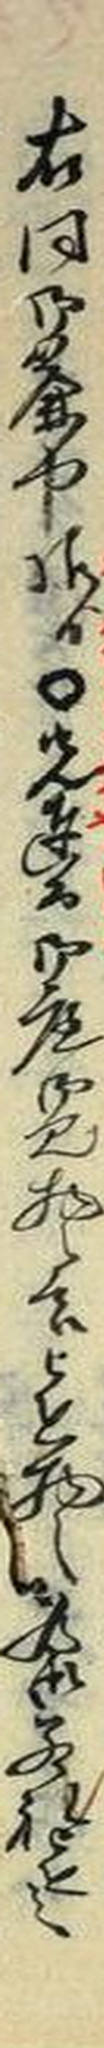右同御簾中様ゟ○先達而御庭御見物之節被進物之為御答礼被進之
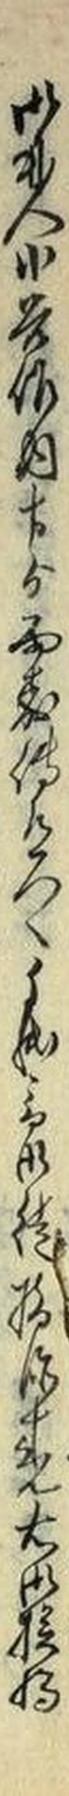御用人小谷作内方ゟ雨森伝左衛門へ手紙ニ而御徒指添来ル右御挨拶
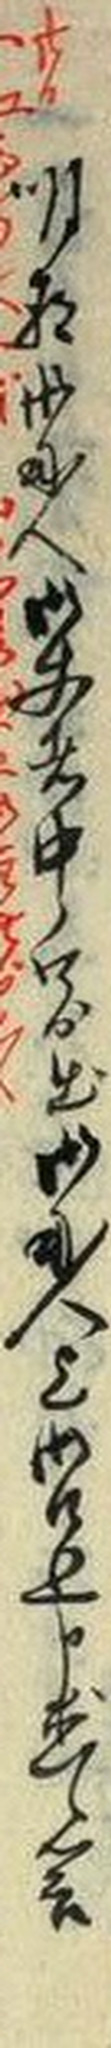明朝御用人御使者中ノ口ゟ出御用人迄御口上申述候筈
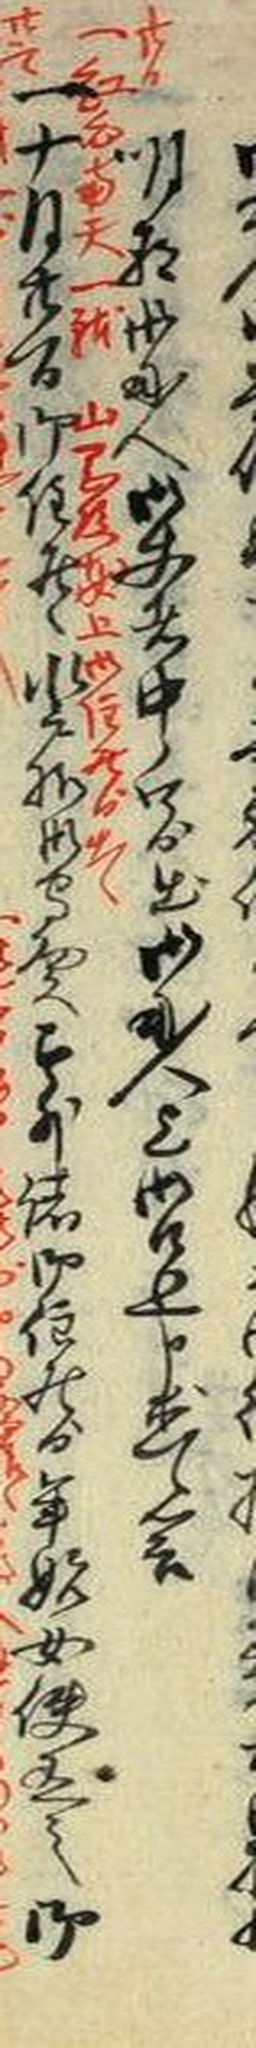一十月廿一日御住居へ水戸様御守殿其外諸御住居ゟ年始女使有之御
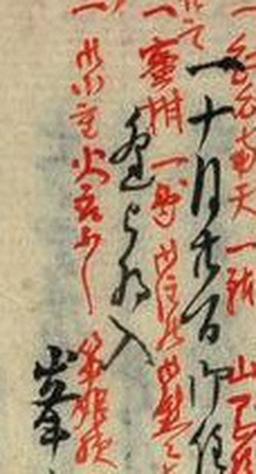逢被為入
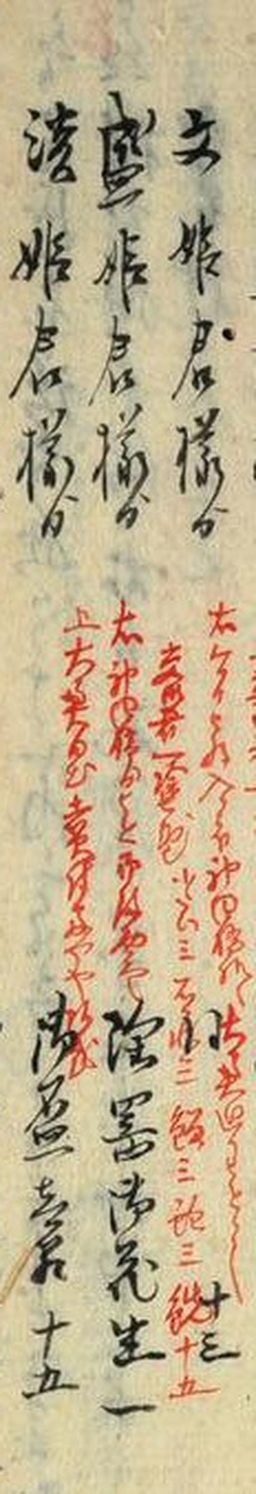盛姫君様ゟ陶器御花生一
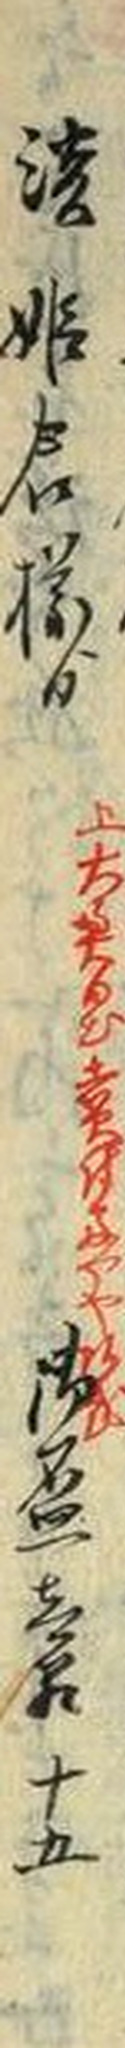溶姫君様ゟ御盃壱箱十五
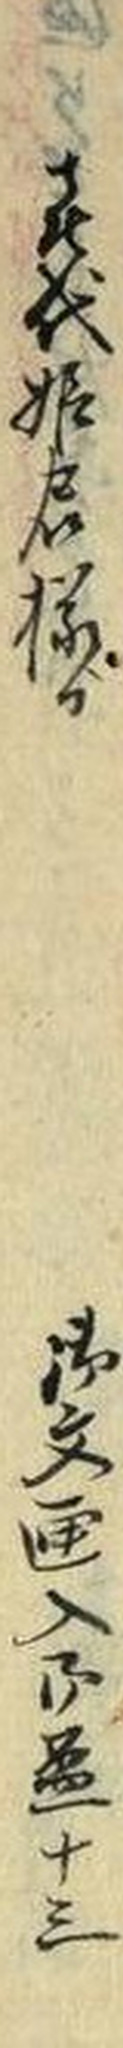喜代姫君様ゟ御文匣入御盃十三

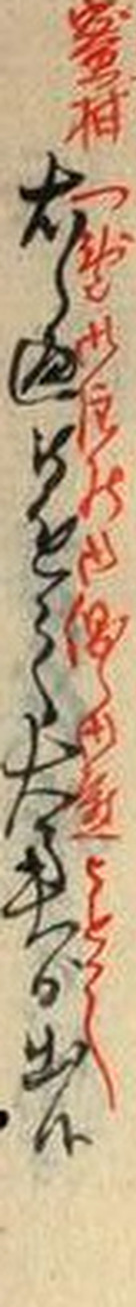右之通被進之大奥ゟ出候
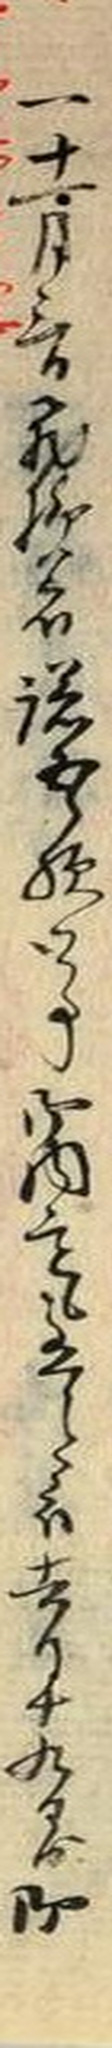一十一月三日飛脚着謙五郎様御事御内意も有之候ニ付去月十九日ゟ御
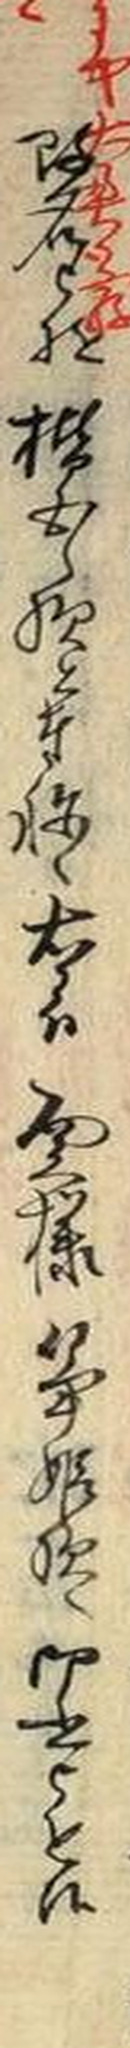改名被遊揩五郎様と奉称候右ニ付殿様箏姫様へ御書被進候
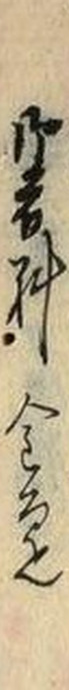御肴料金百疋
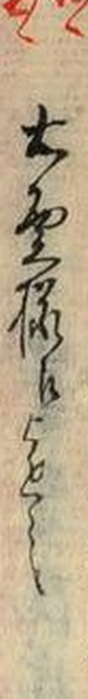右殿様江被進之
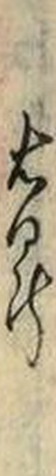右同断
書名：少傅日録抄（斉承付側向頭取日記、在府）
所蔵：福井県文書館 Fukui Prefectural Archives
